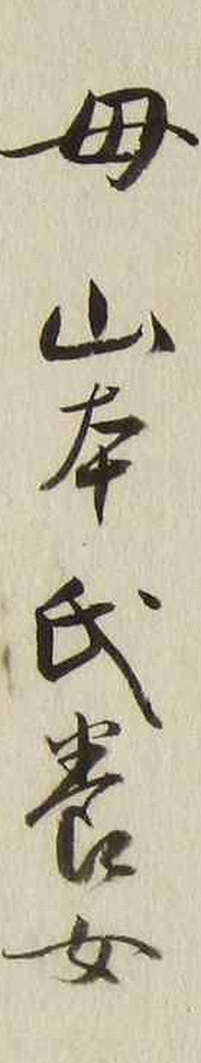母山本氏養女

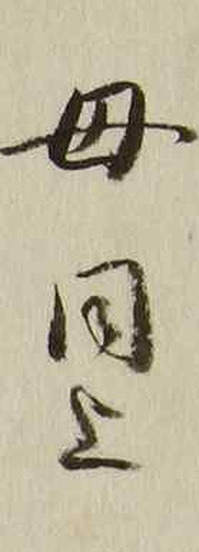母同上
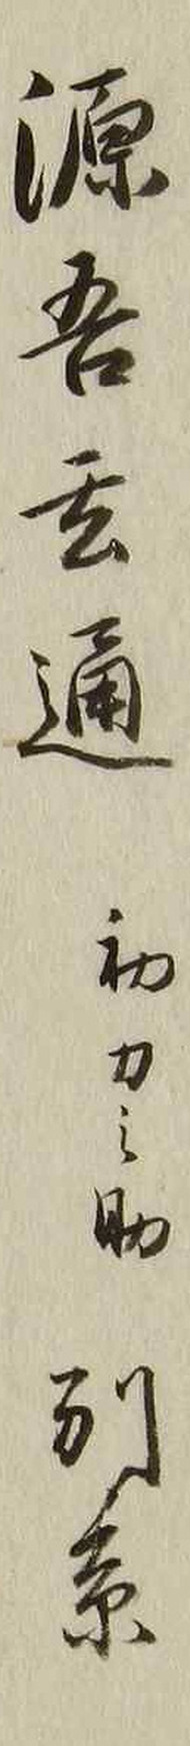源吾玄通初カ之助別系
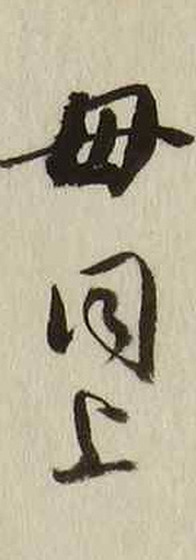母同上
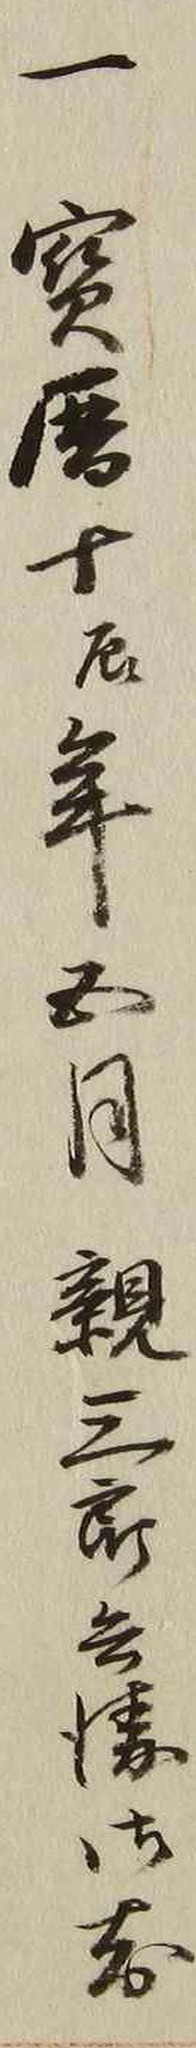一宝暦十辰年五月親三節兵幡御知
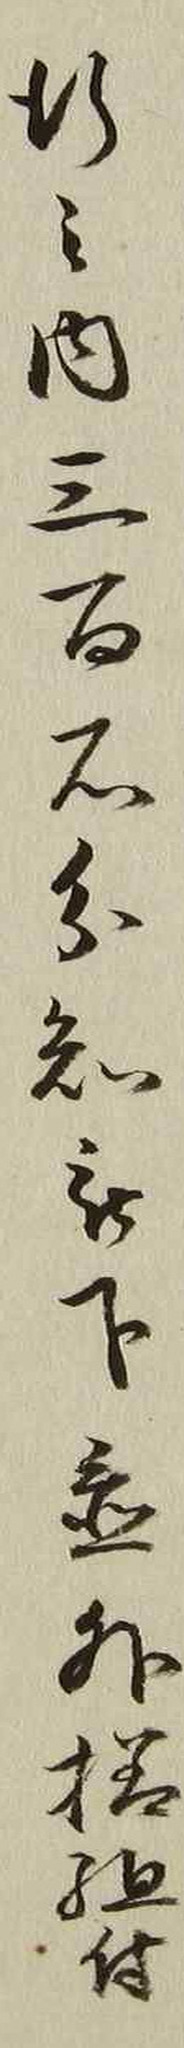行之内三百石分知被下置外様組付
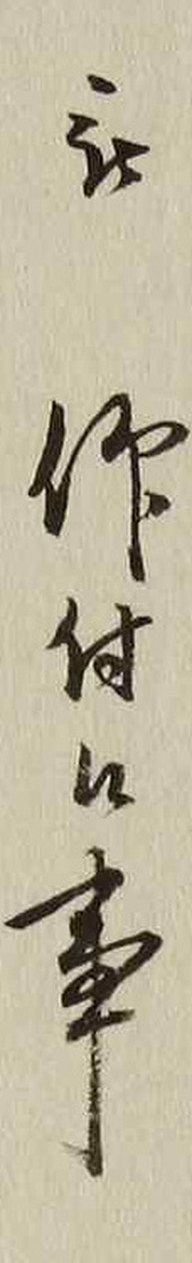被仰付候事
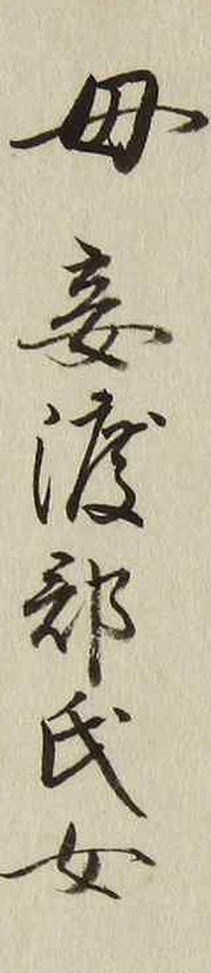母妾渡部氏女
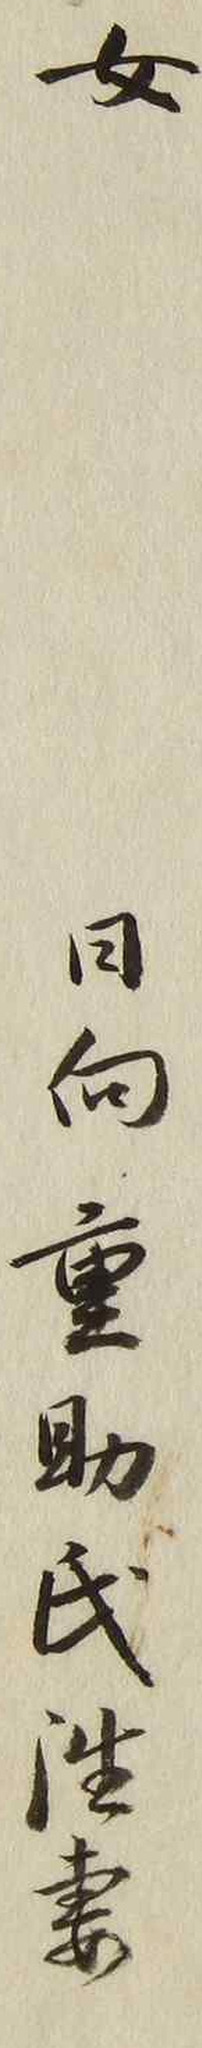女日向重助氏泩妻
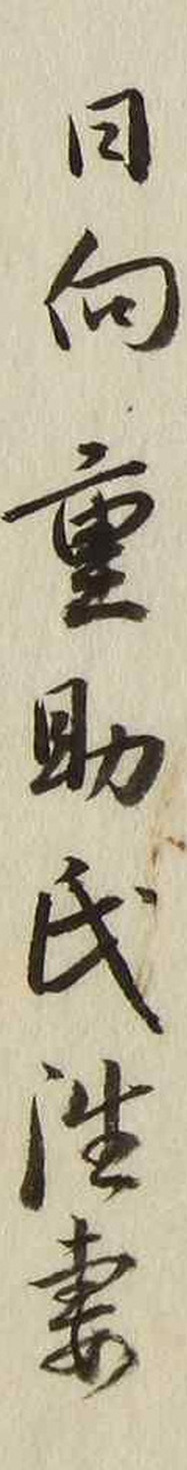女日向重助氏泩妻
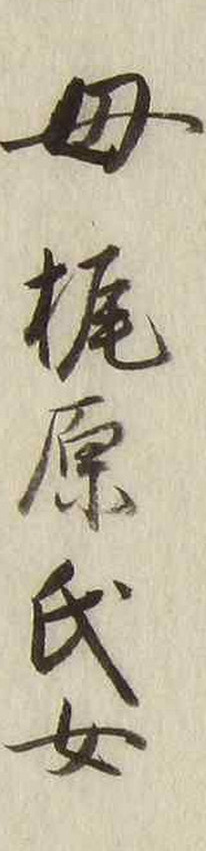母梶原氏女

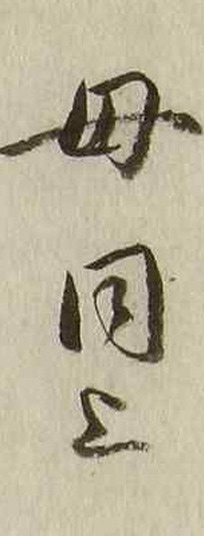母同上
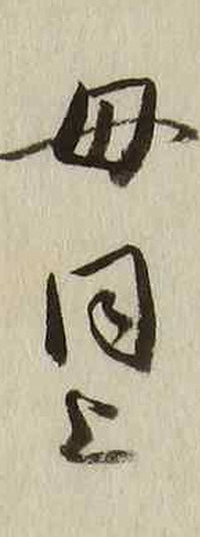母同上
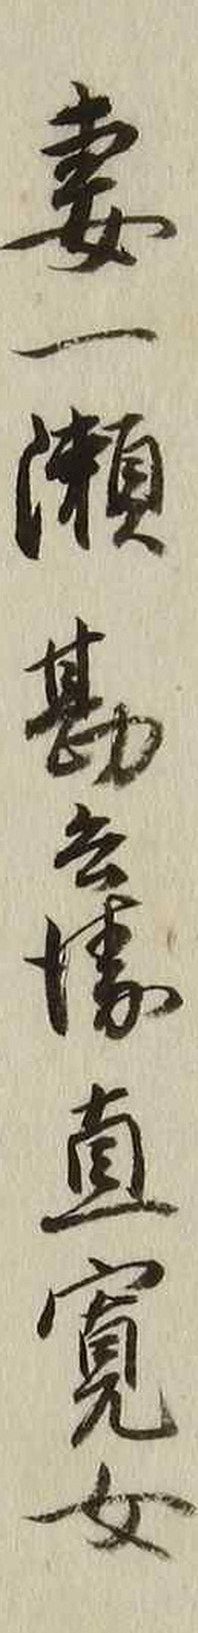妻一瀬勘兵衛直寛女
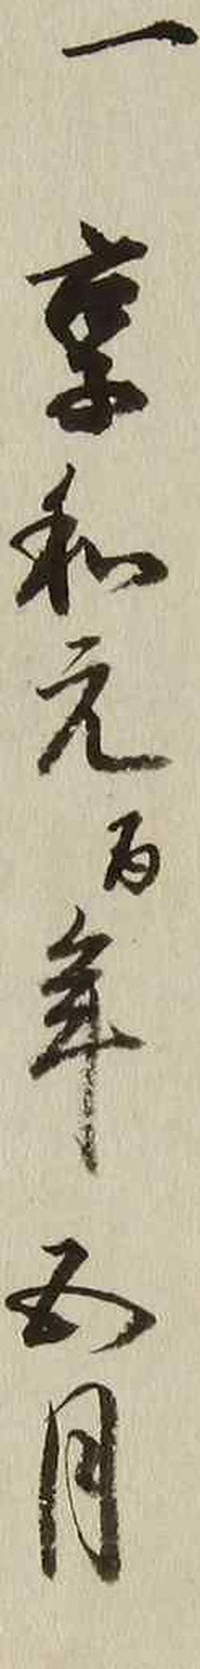一享和元酉年五月
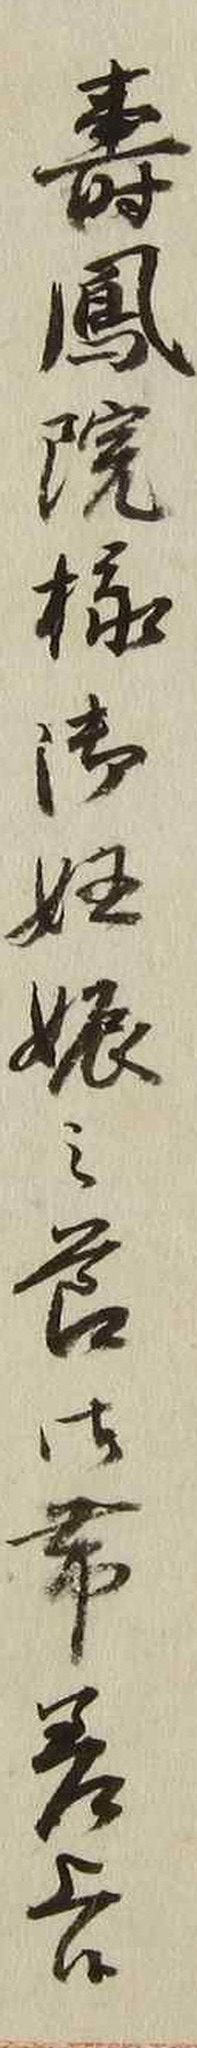寿鳳院様御妊娠之節御帯差上候
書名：諸士系譜　巻之125　た之部1
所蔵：会津若松市立会津図書館
